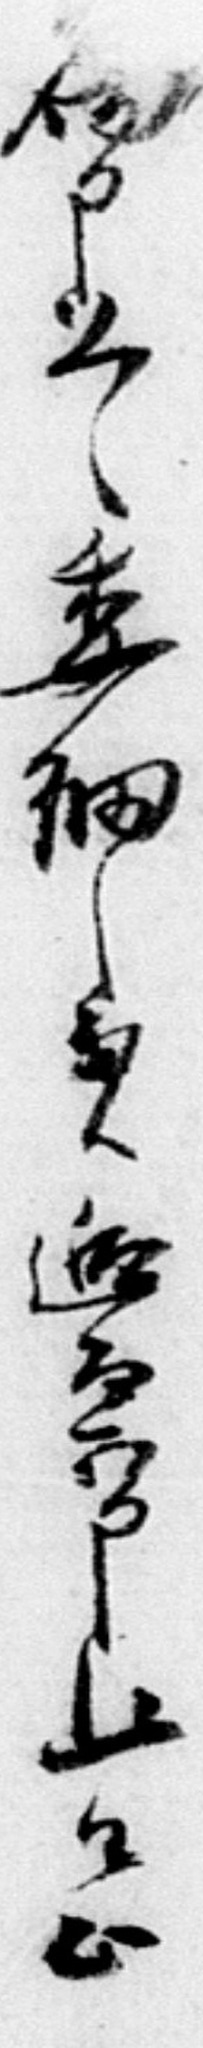申上候委細之義は追而可申上候以上
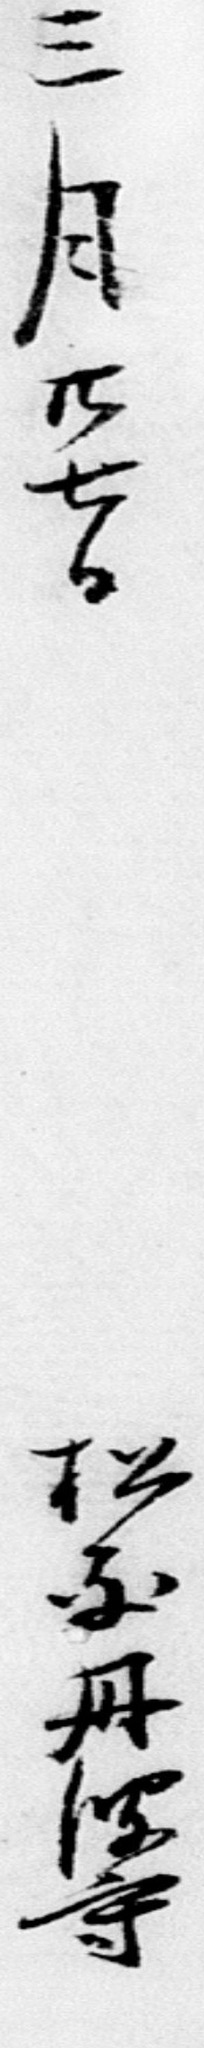三月廿七日松平丹波守
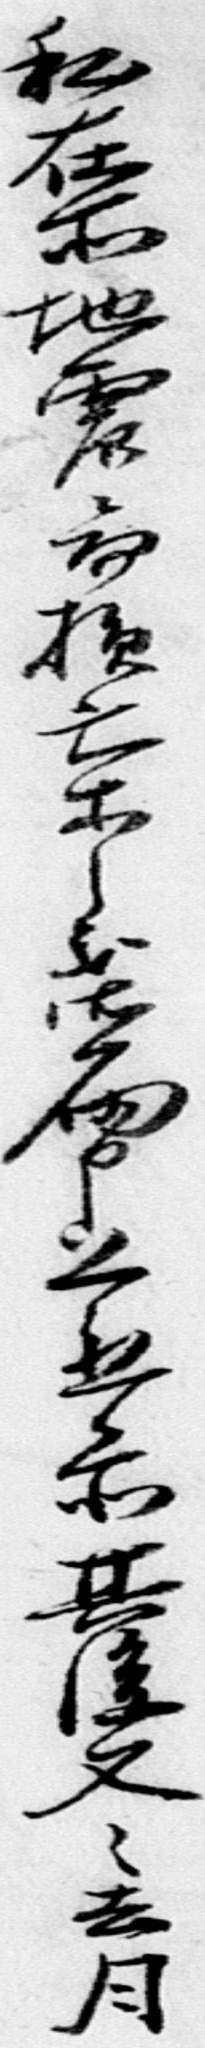私在所地震に而損亡等之義御届申上置候所其後又々去月
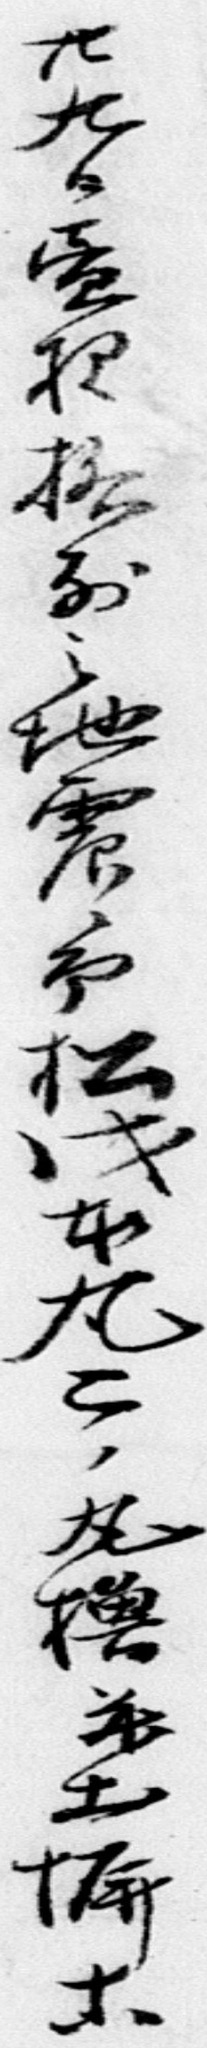廿九日昼夜格別之地震に而松代本丸二の丸櫓幷土塀等
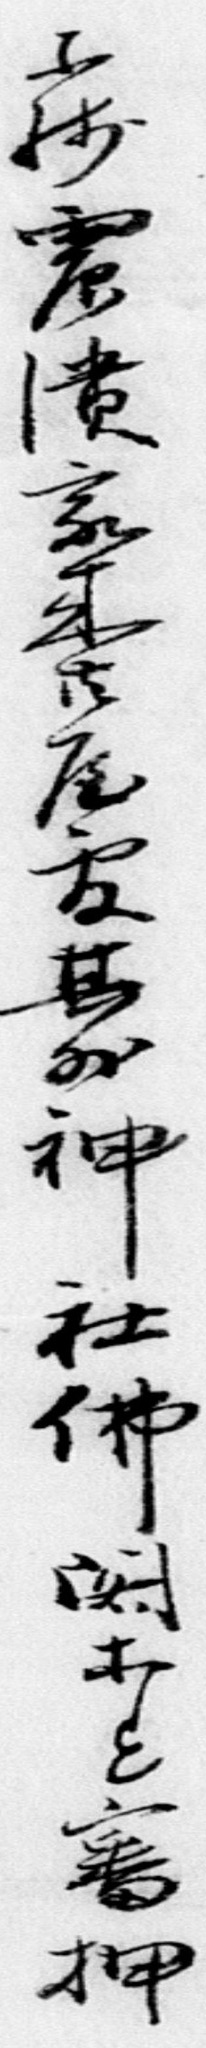不残震潰家来共屋敷其外神社仏閣等迄審押
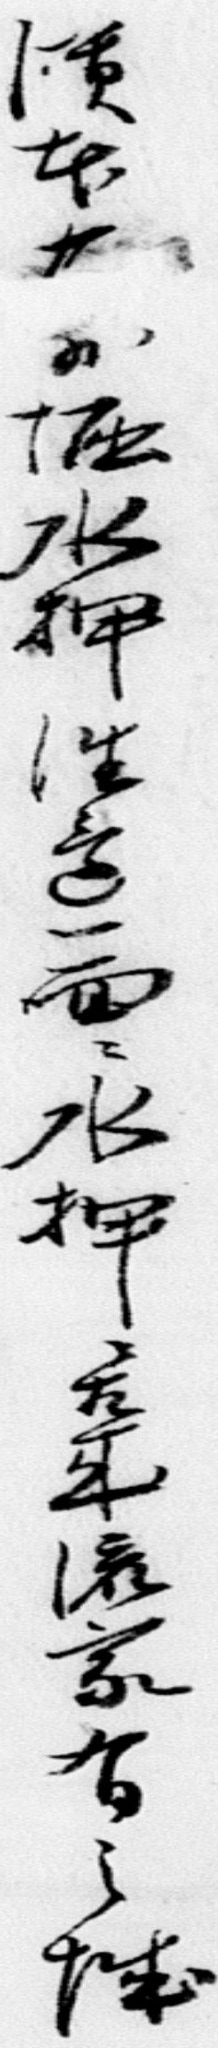潰本丸外堀水押往還一面に水押に相成流家有之城
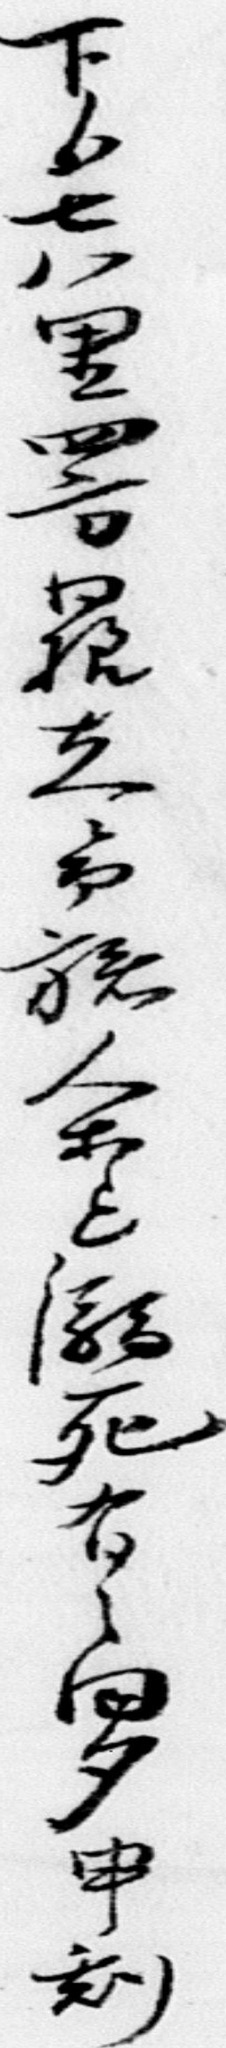下ゟ七八里四方同様夫に而旅人等迄溺死有之同夕申刻
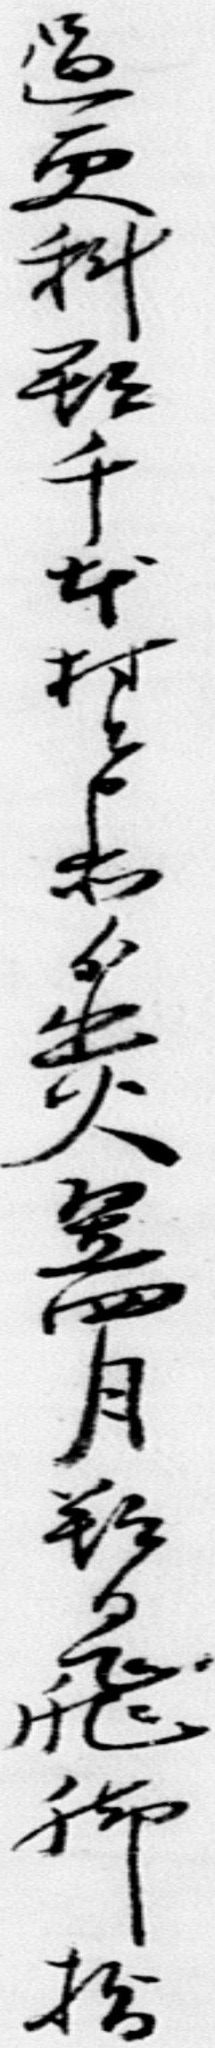過更科郡千本村と申所ゟ出火翌四月朔日飛脚指
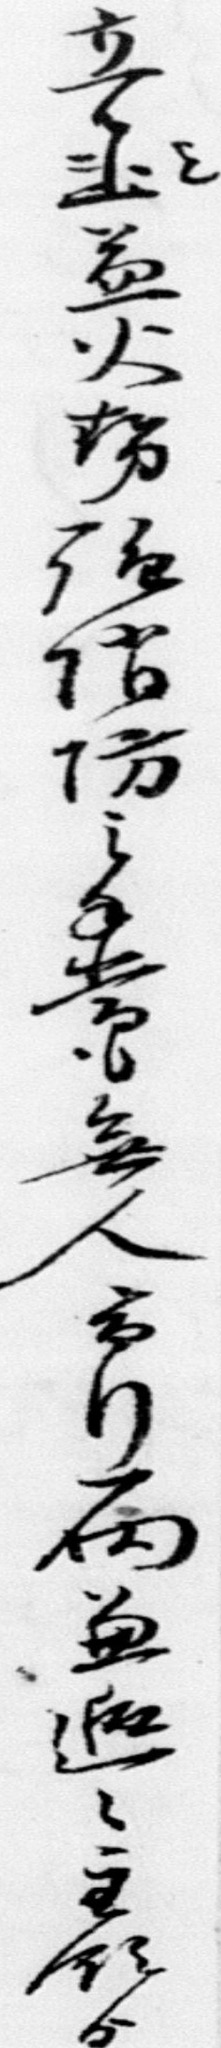立候迄益火勢強消防之手当も無人に而行届兼追々主領ゟ
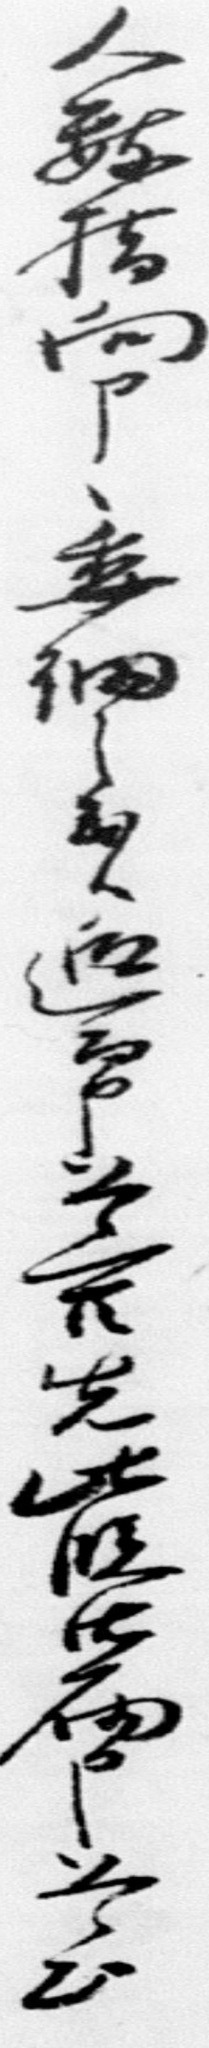人数指向申候委細之義は追而申上候へ共先此段御届申上候以上
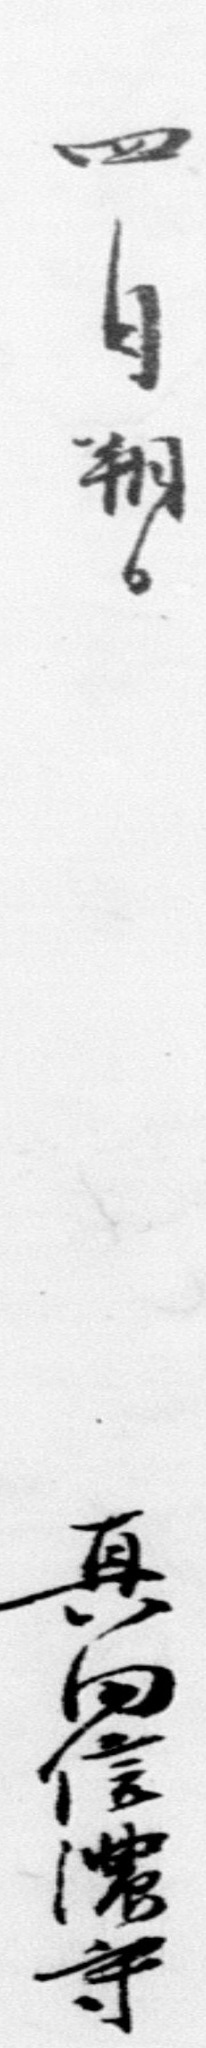四月朔日真田信濃守
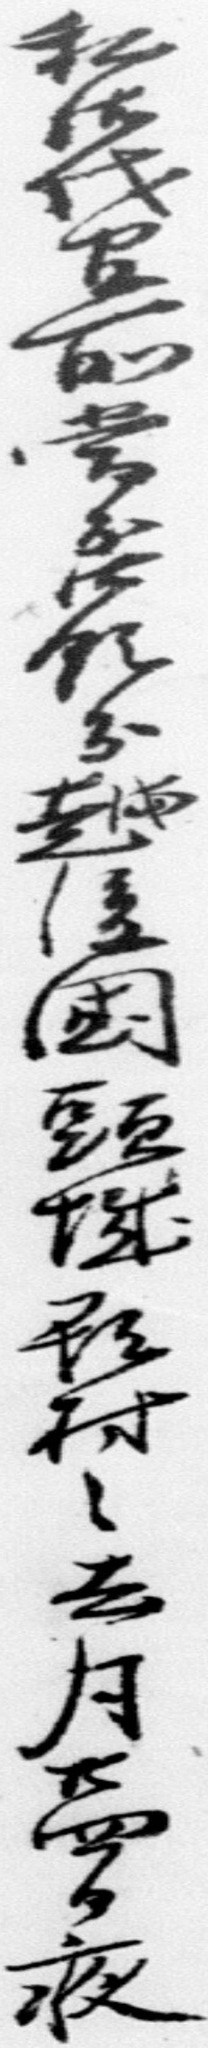私御代官所当分御領分越後国頸城郡村々去月廿四日夜
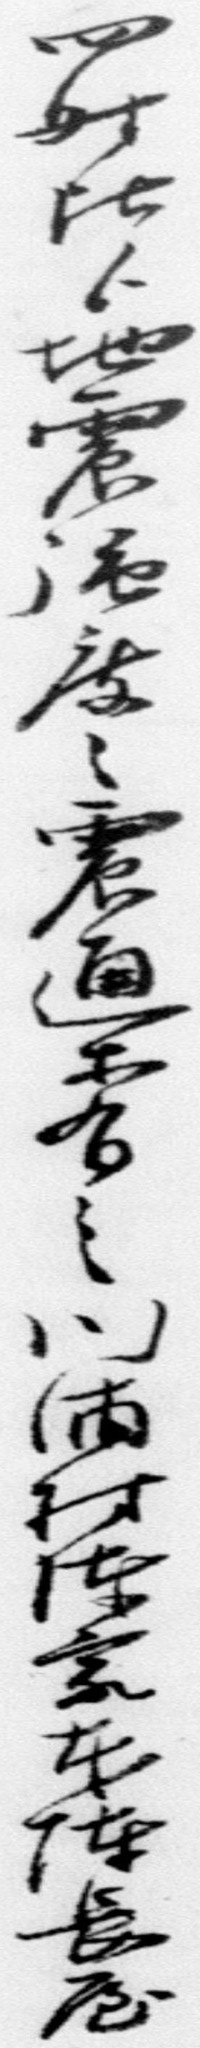四時頃ゟ地震強度々震通等有之川浦村陣家本陣長屋
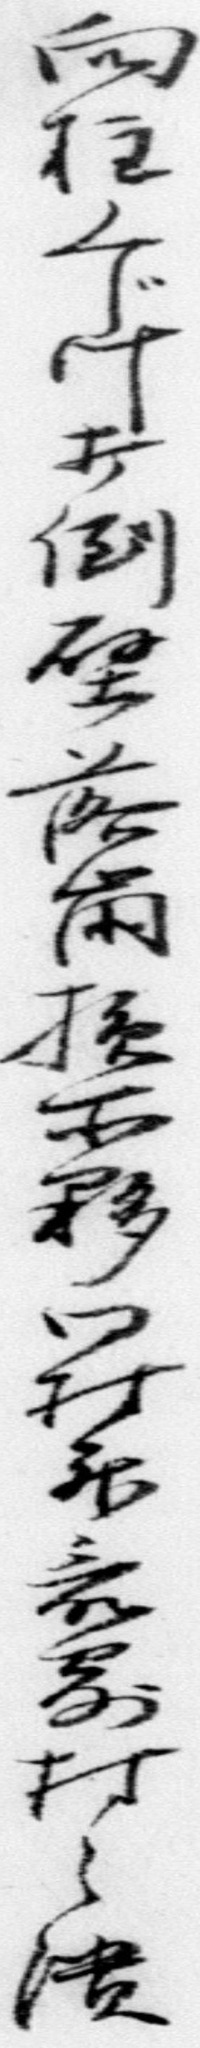向柱くじけ打倒壁落崩損所夥同村幷最寄村々潰
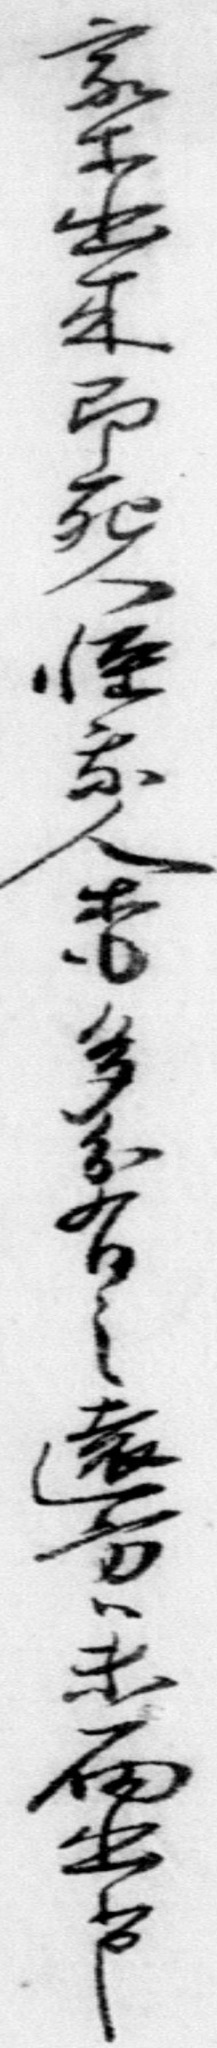家等出来即死人怪我人等も多分有之遠方は未届出不申
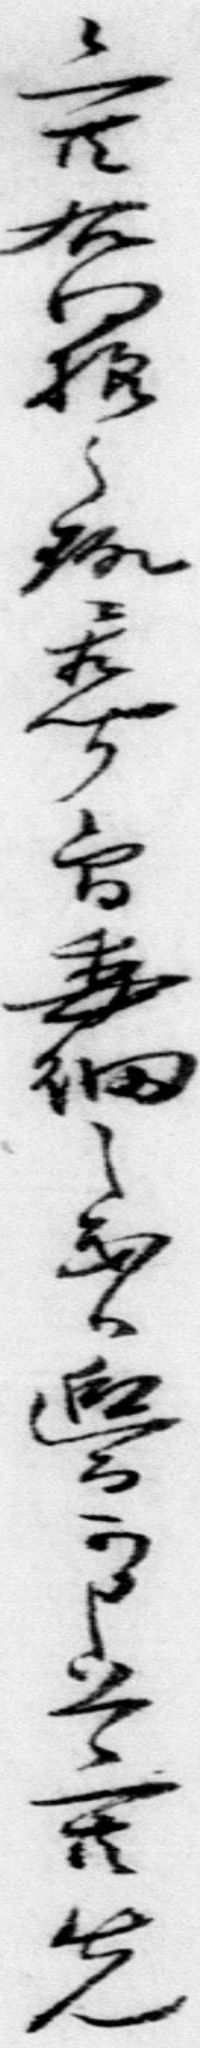候へ共右同様之趣に相聞候間委細之義は追而可申上候へ共先
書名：信州大地震一件
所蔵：徳島県立図書館
